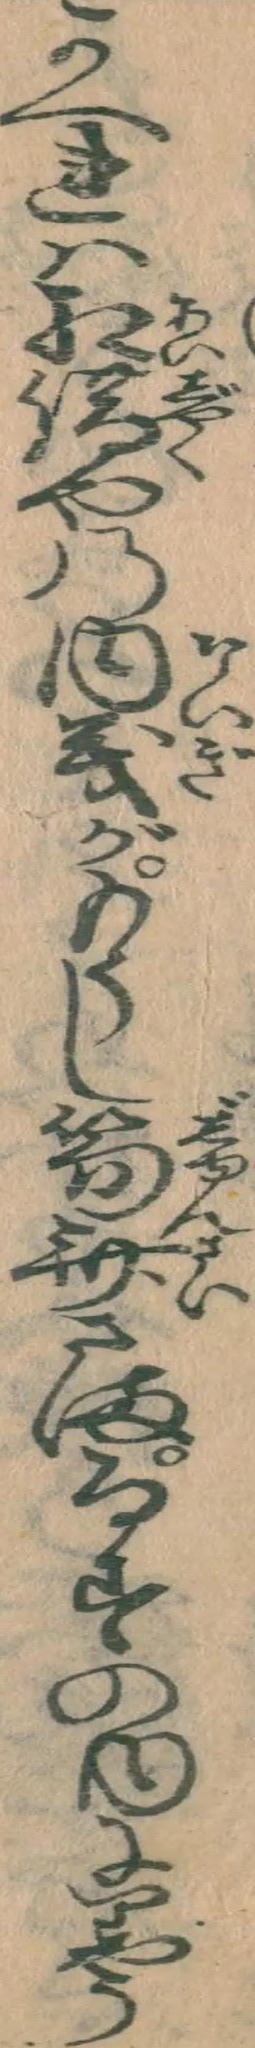かへれは相借やの内義が。もうし筍斎さま。るすの内にりやう
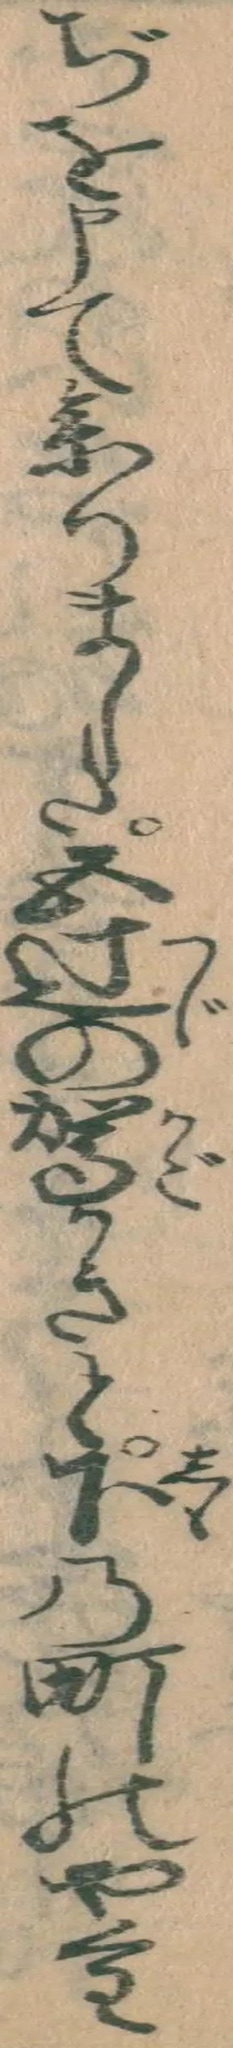ぢを申て参りました。五辻の駕かきと。下の町のやくわ
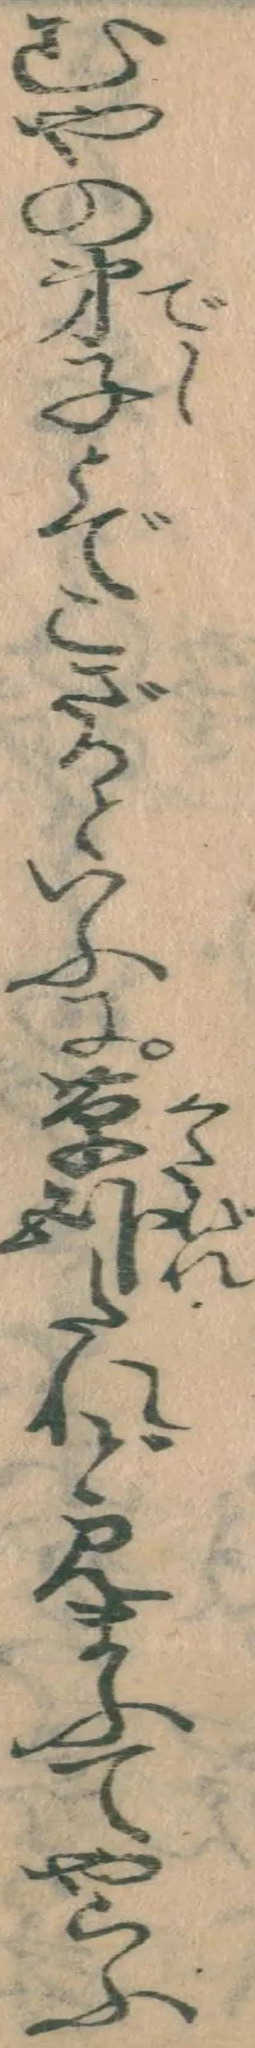むやの弟子とでこざるといふに。草臥たれどみまふてやらふ
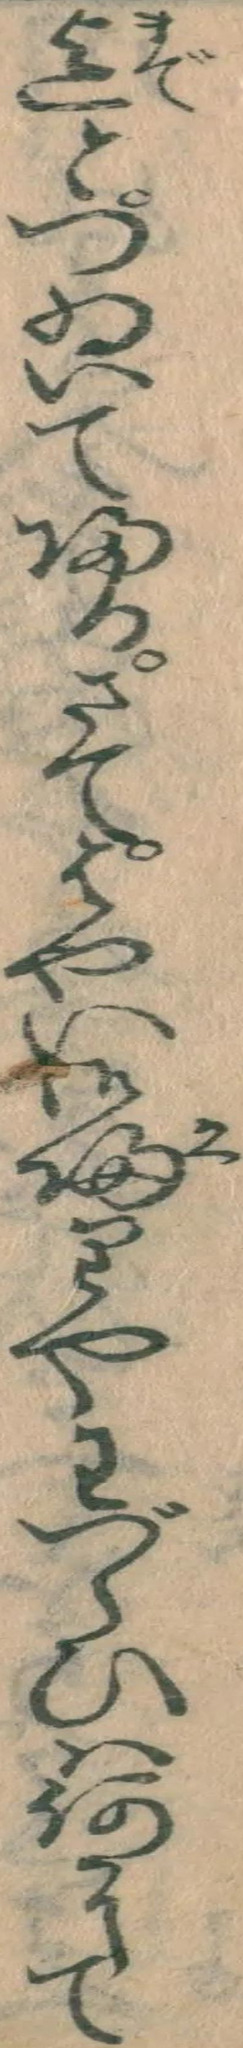迄と。つゐいて帰る。さて。はやい御帰りやわづらひは何にて
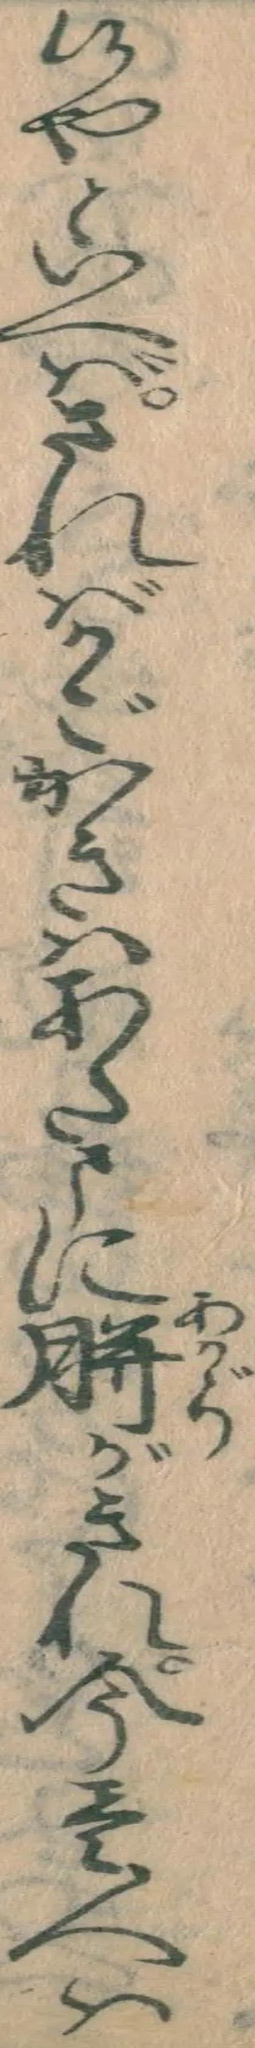候やといへば。さればかごかきはあたまに胼がきれ。今壱人は
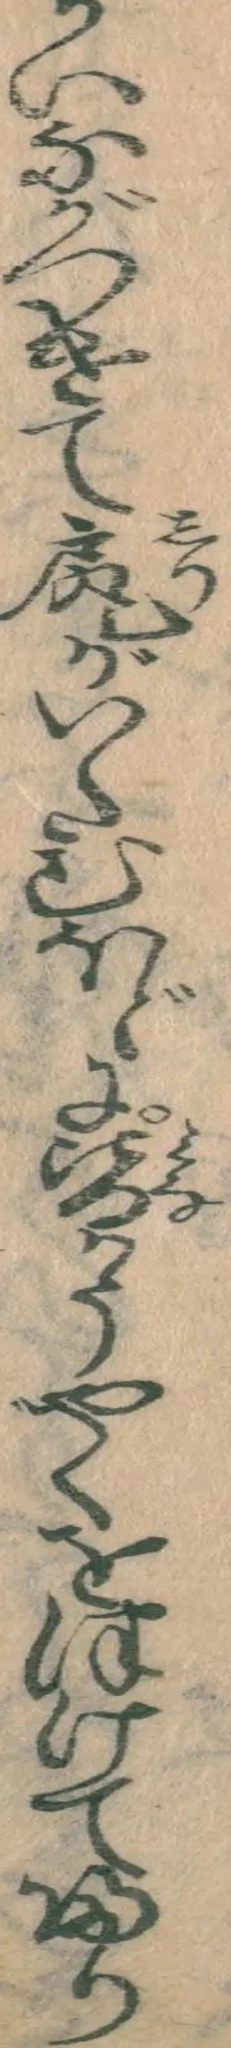かいながつけて尻がいたむほどに。皆かうやくをつけて帰り
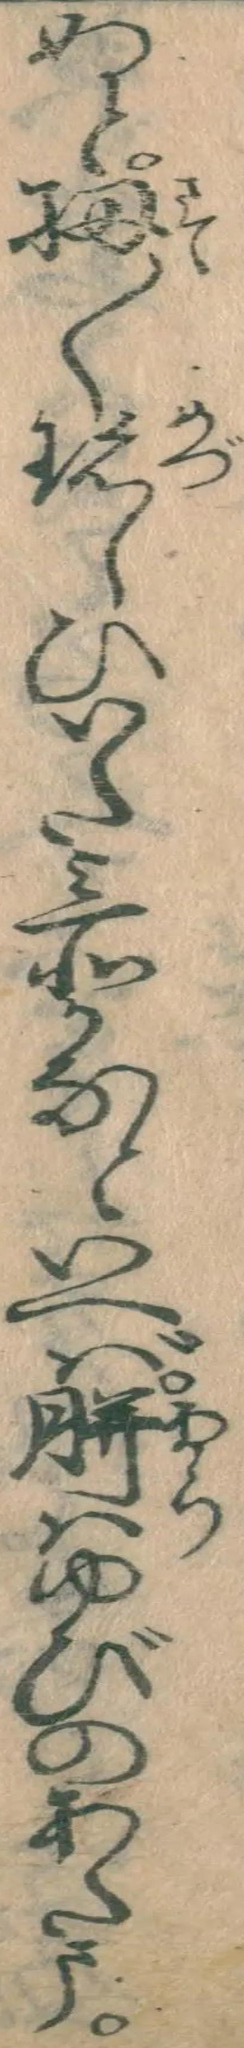ぬと。扨々珍しひいたみ所かなといへば。胼はゆびのあたま。
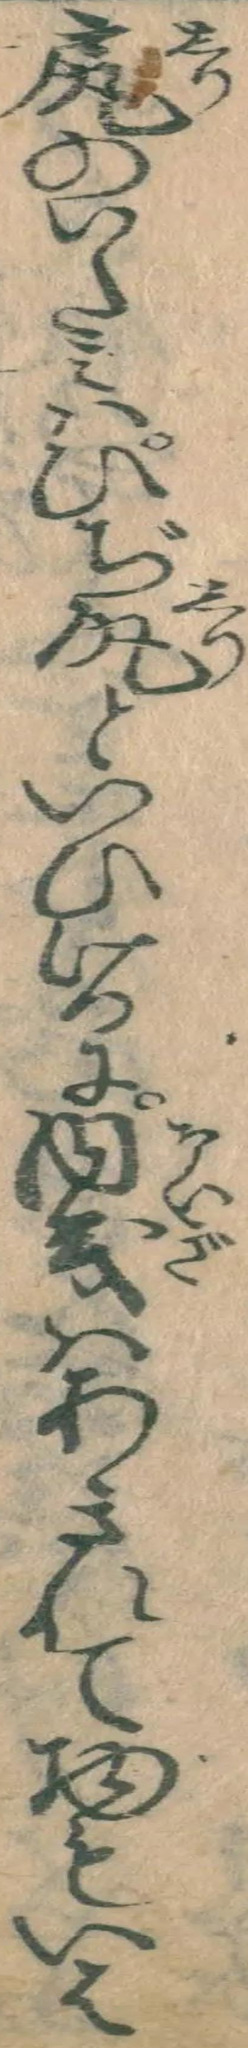尻のいたみは。ひぢ尻といひけるに。内義はあきれて物もいは
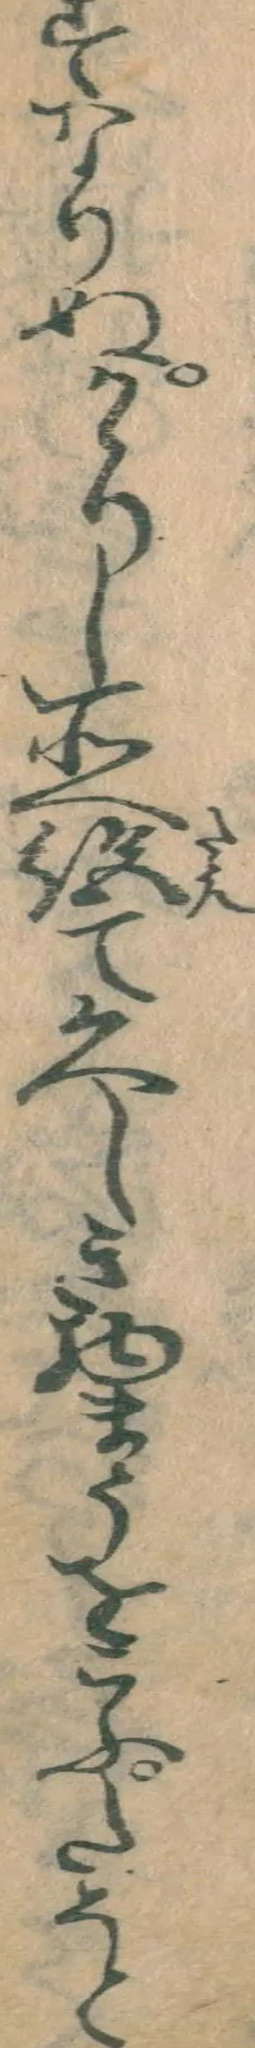すなりぬ。かゝりし所へ絶て久しき物まうをこふ。たそと

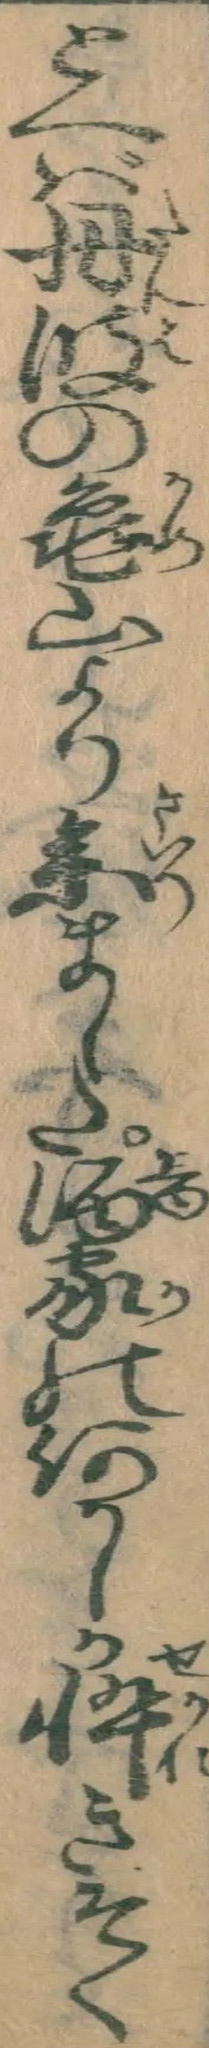とへば丹波の亀山より参ました。酒家の何かしか忰きそく
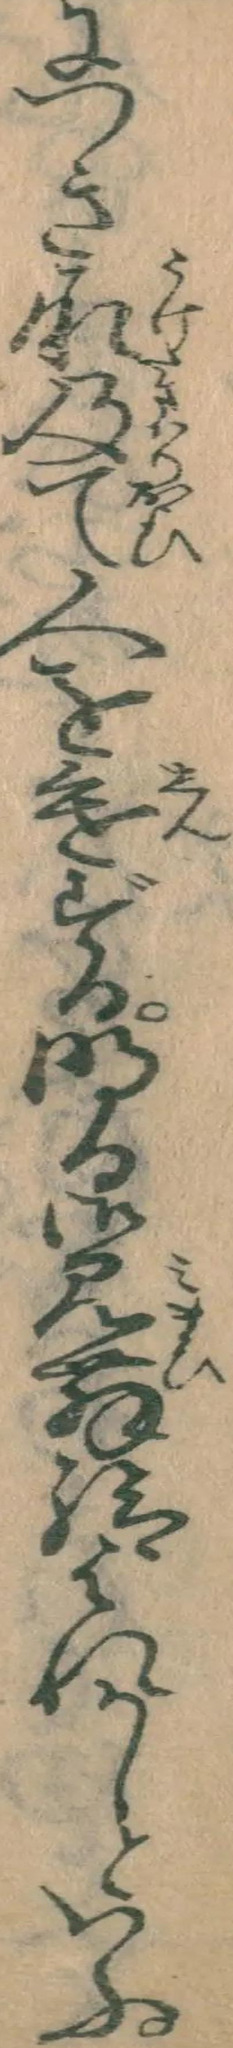につき承及て人を進ずる。明日御見舞給はれかしといふ。
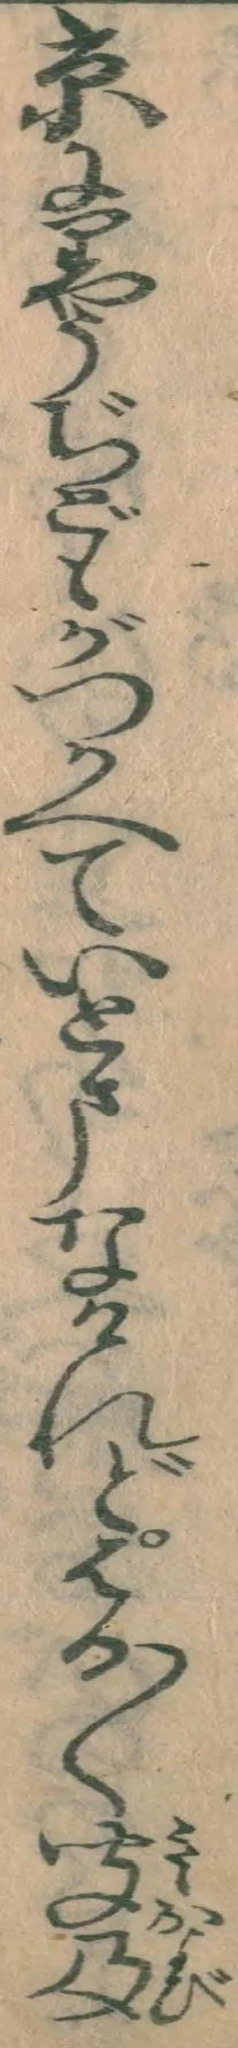京にりやうぢどもがつかへていとまなけれど。はる〳〵聞及
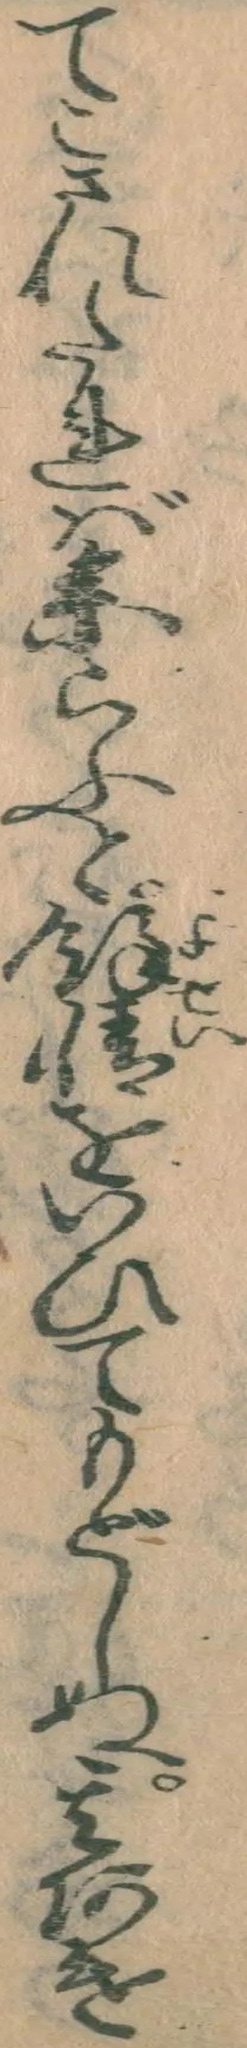てこされたれば参らふと余情をいひてもどしぬ。其あけ
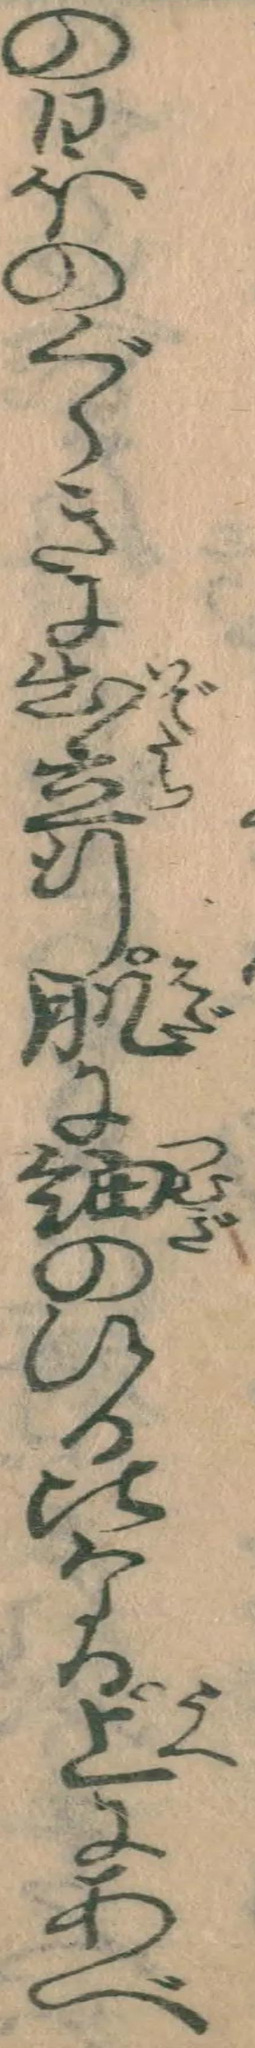の日ほのぐらきに出立行。肌に紬のひる比なる。上にあべ
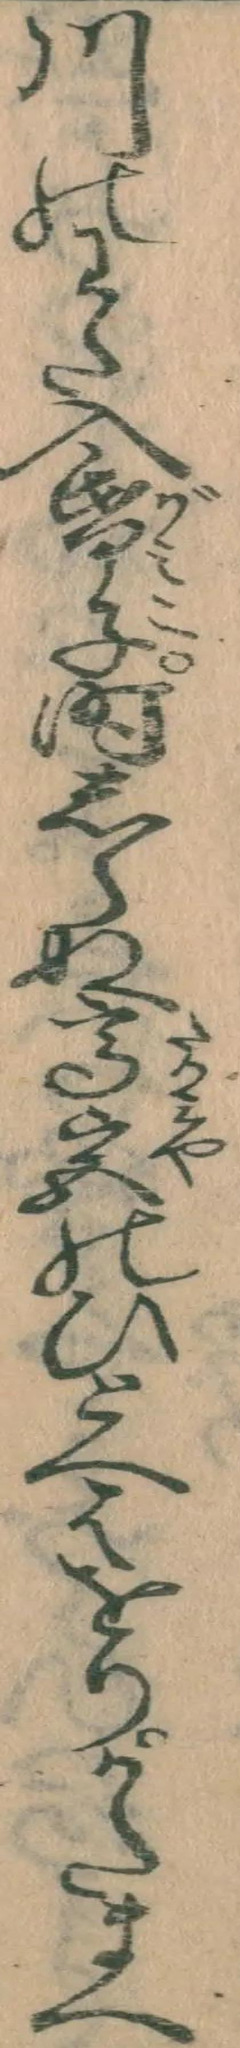川のわた入紙子。時しらぬ高宮のひとへはをり。かたまへ
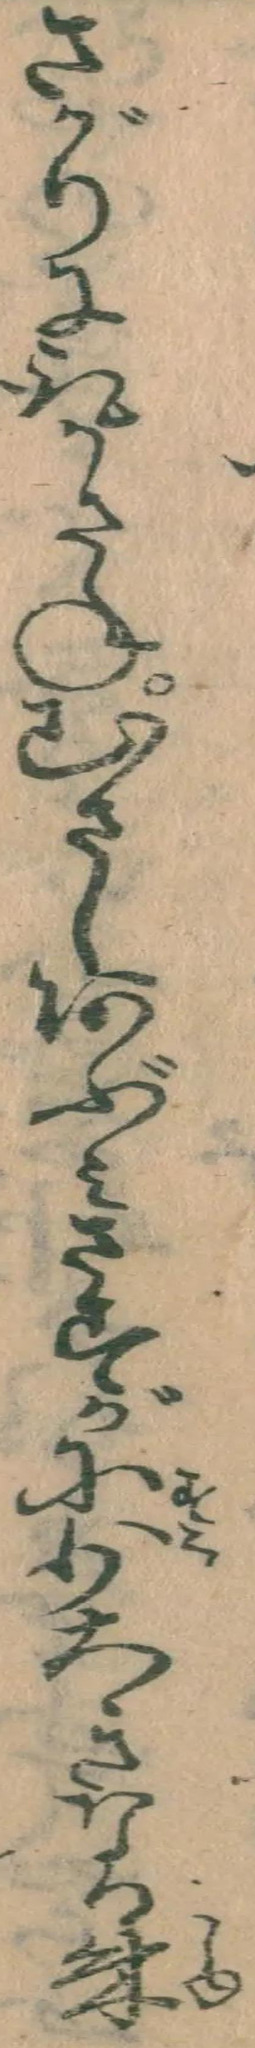さがりに取かさね。むさしあぶみさすがに少大きなる朱
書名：新竹斎 5巻
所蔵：国立国会図書館 National Diet Library, JAPAN
